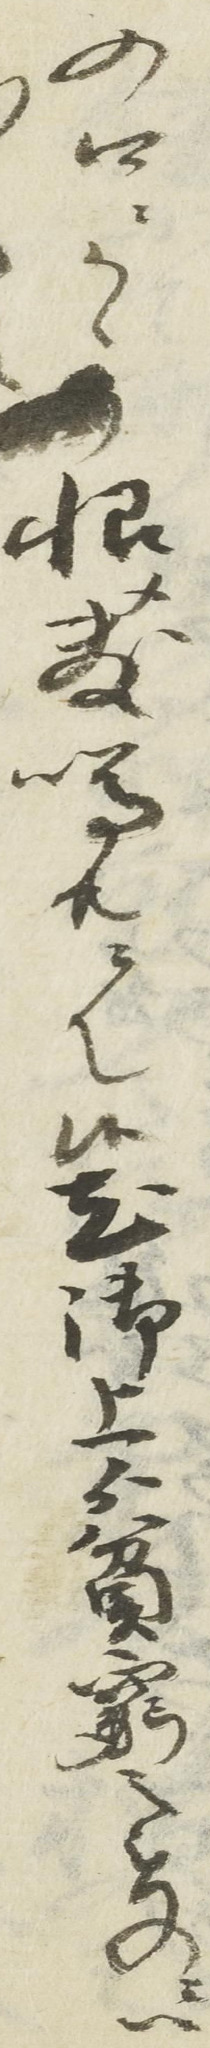の口ニ候はゝ恨メ敷噂共ニて候尤御上ゟ貧窮之ものニは
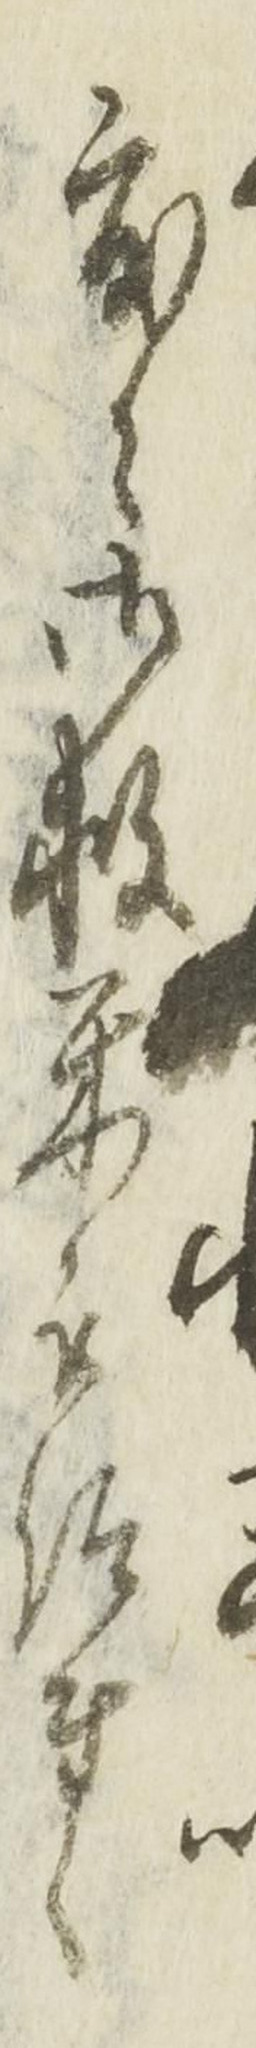度〻御救米被仰付候
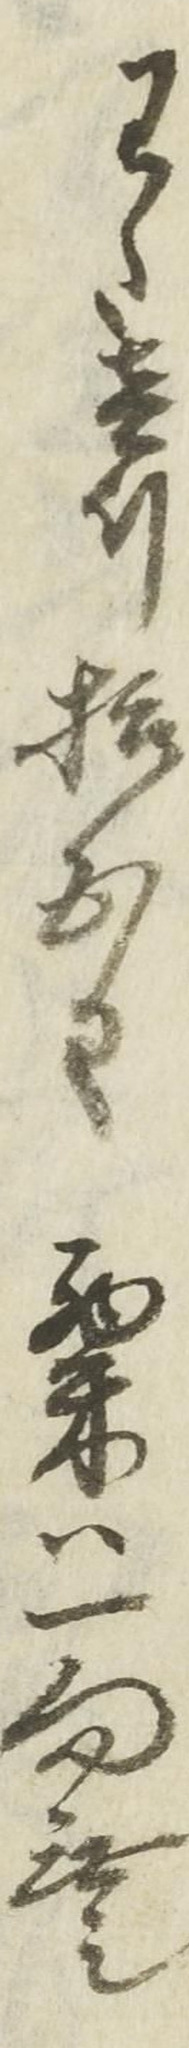わた壱斤拾五匁粟は一向無シ
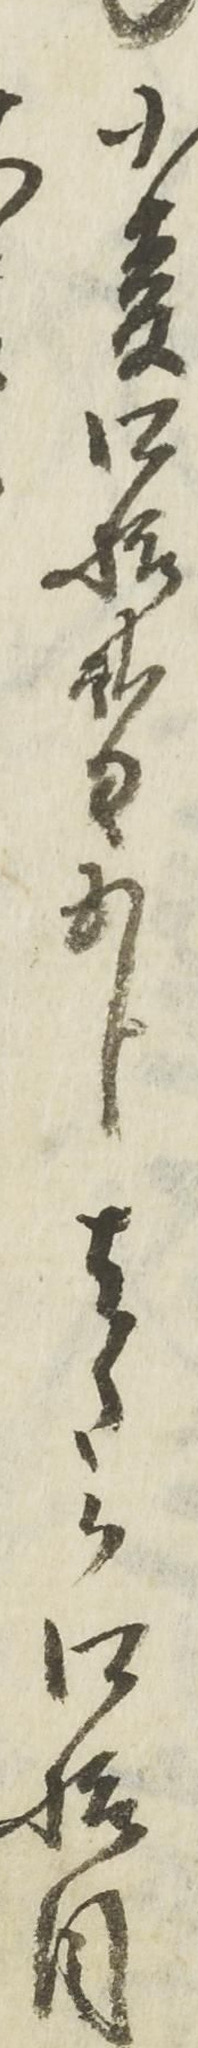小麦四拾弐匁五分はたケ四拾目
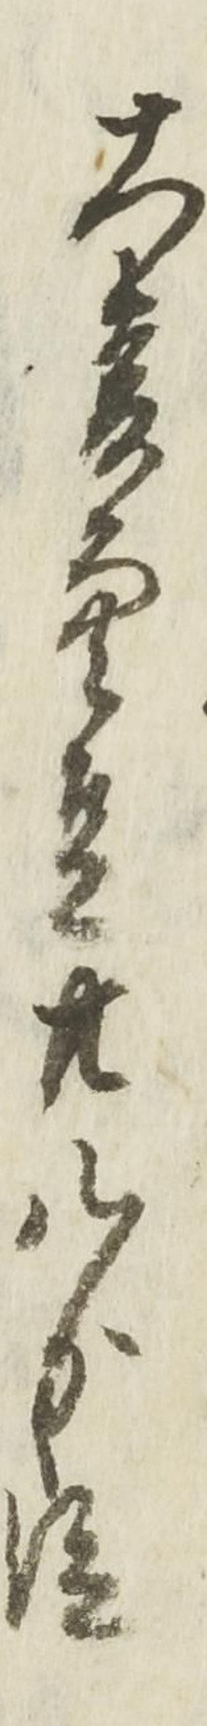大麦空豆廿八匁位
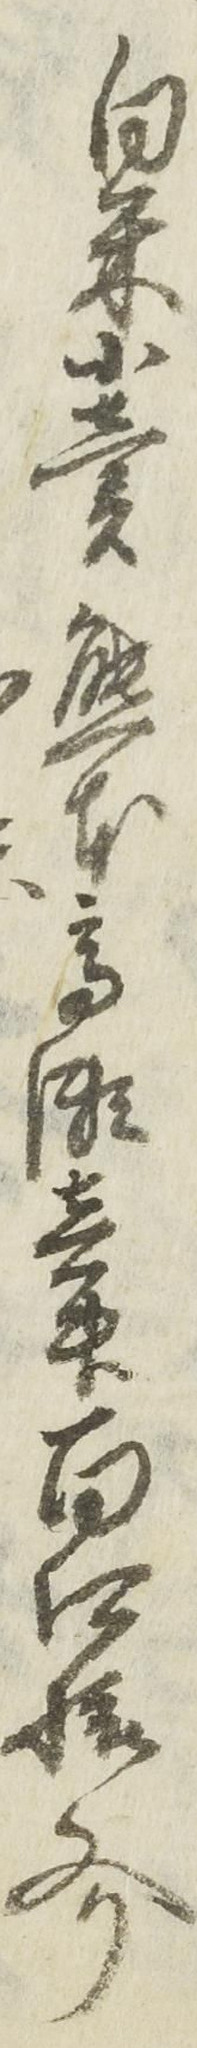白米小売熊本高瀬壱升百四拾文
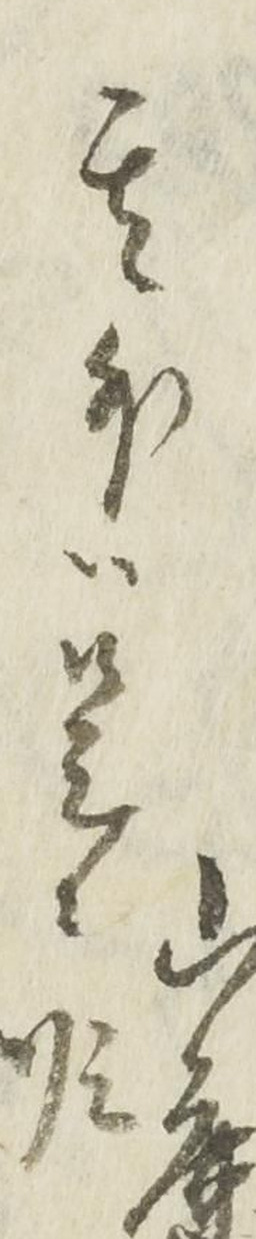其外は是ニ順
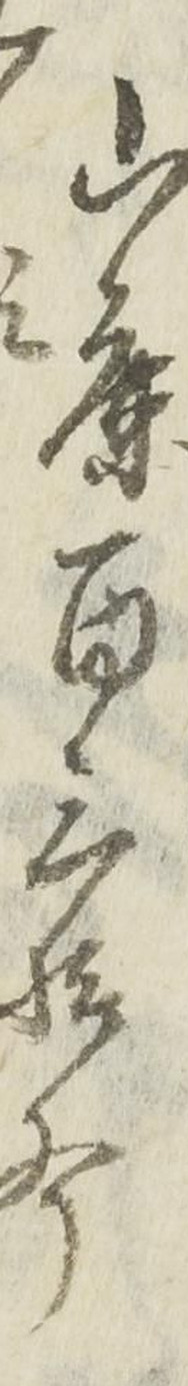山鹿百三拾文
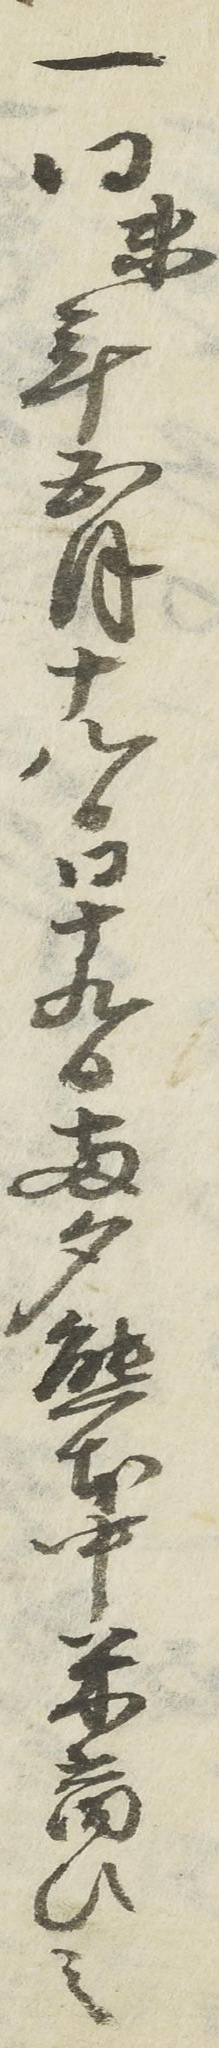一同未年五月十八日同十九日両夕熊本中米商ひ之
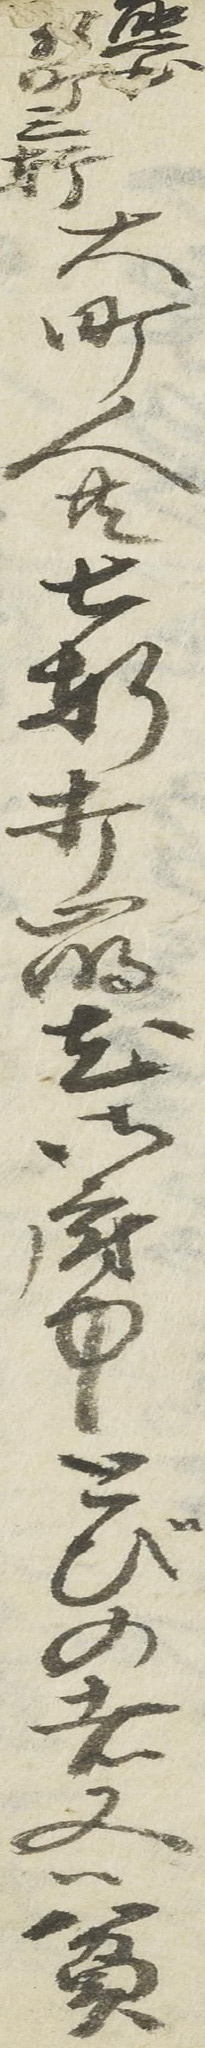大町人共七軒打崩尤御府中とびの者又は貧
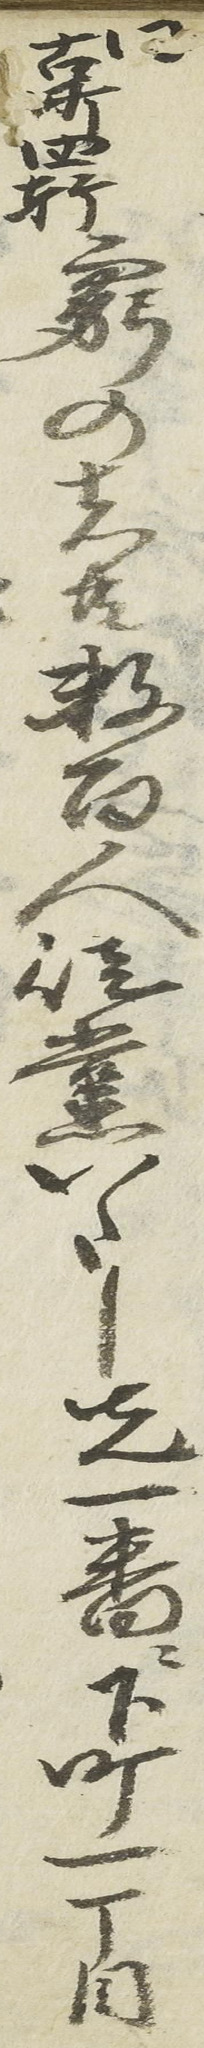窮の者ども数百人徒党いたし先一番ニ下町一丁目
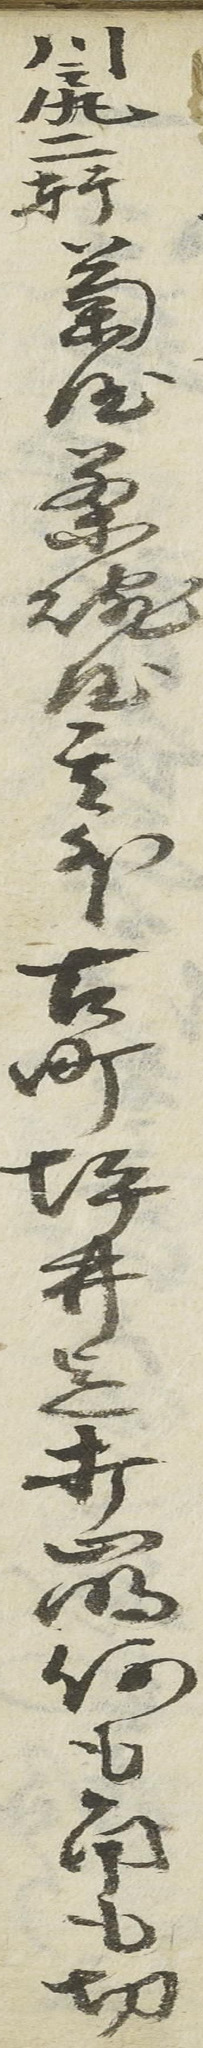菊屋茶碗屋其外古町坪井迄打崩何も角も切
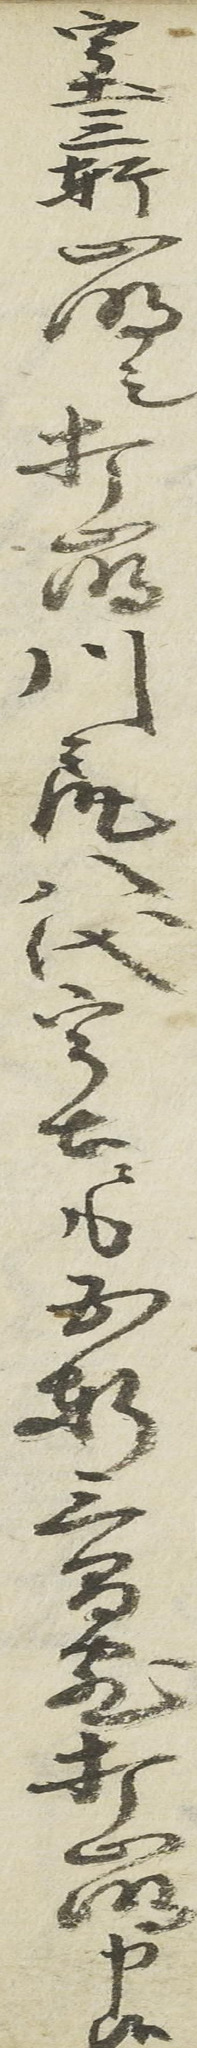崩シ打崩川尻八代宇土ニも五軒三間歟打崩申候
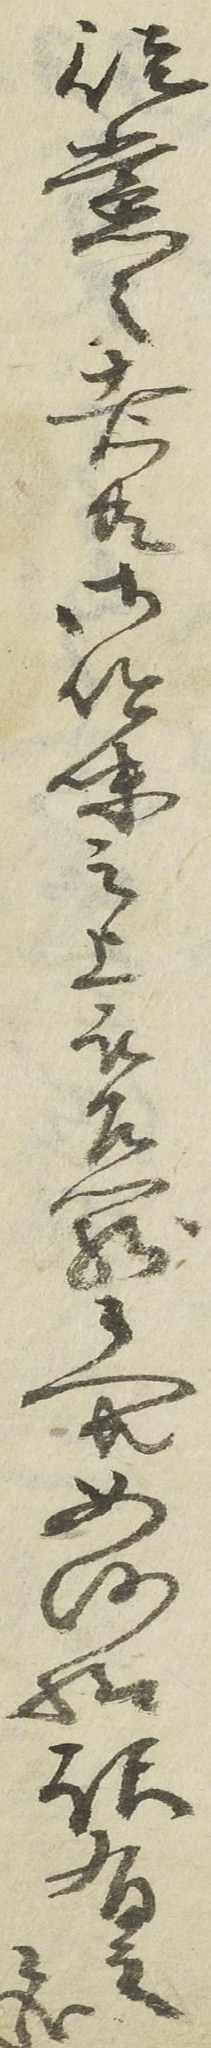徒党之者共御吟味之上被召籠候へ共如何様訳有之候哉

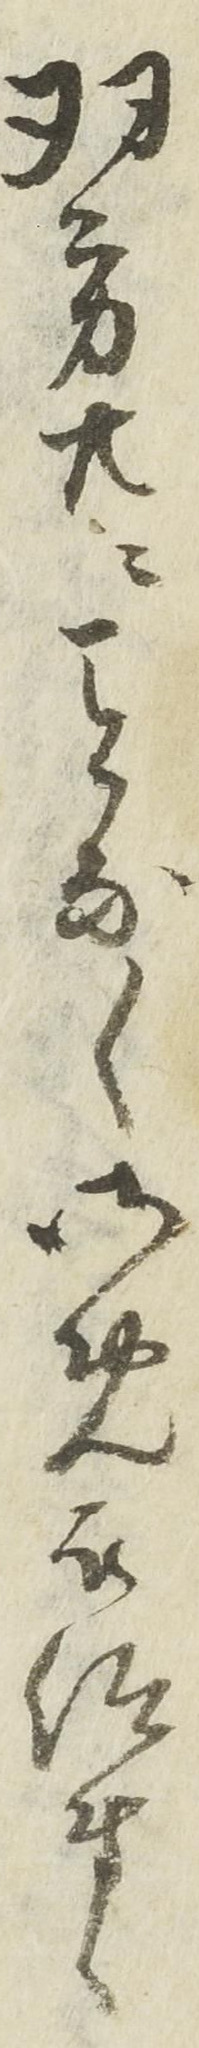双方共ニことなく御免被仰付候
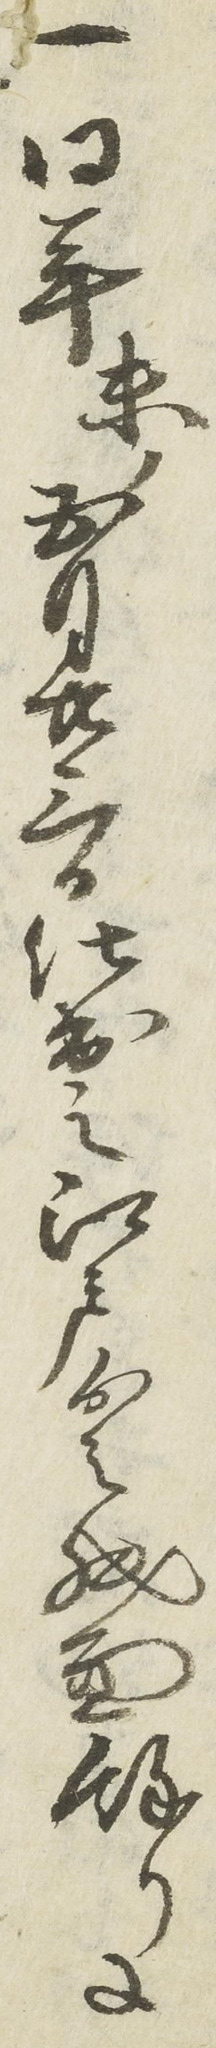一同年未ノ五月廿三日仕出之江戸ゟ之紙面余りに
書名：後見笑
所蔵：東京大学地震研究所図書室 Earthquake Research Institute Library, The University of Tokyo, JAPAN
